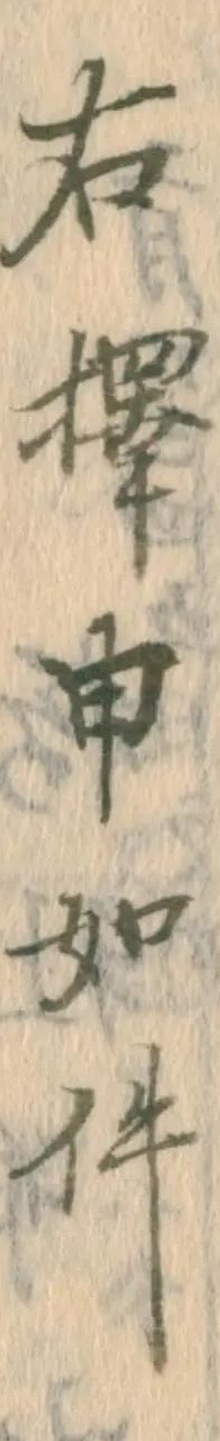右択申如件
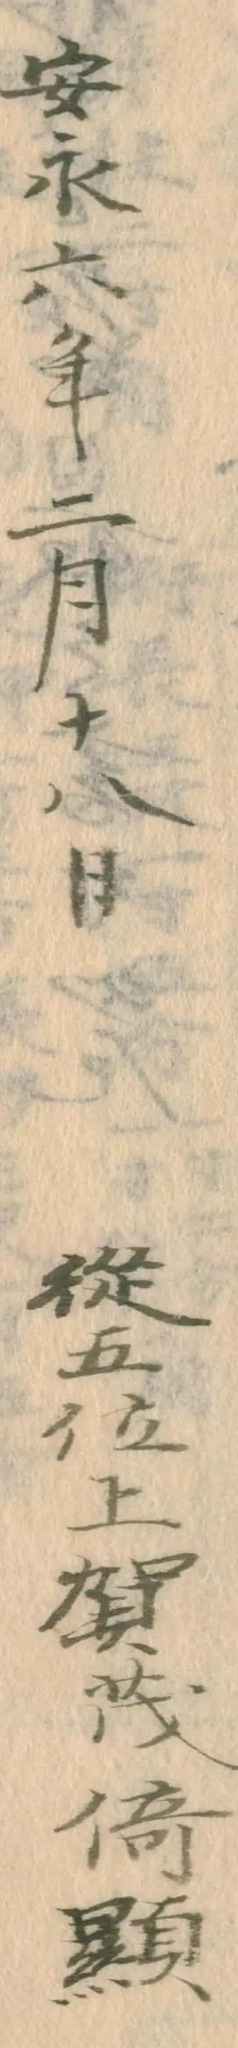安永六年二月十八日従五位上賀茂倚顕
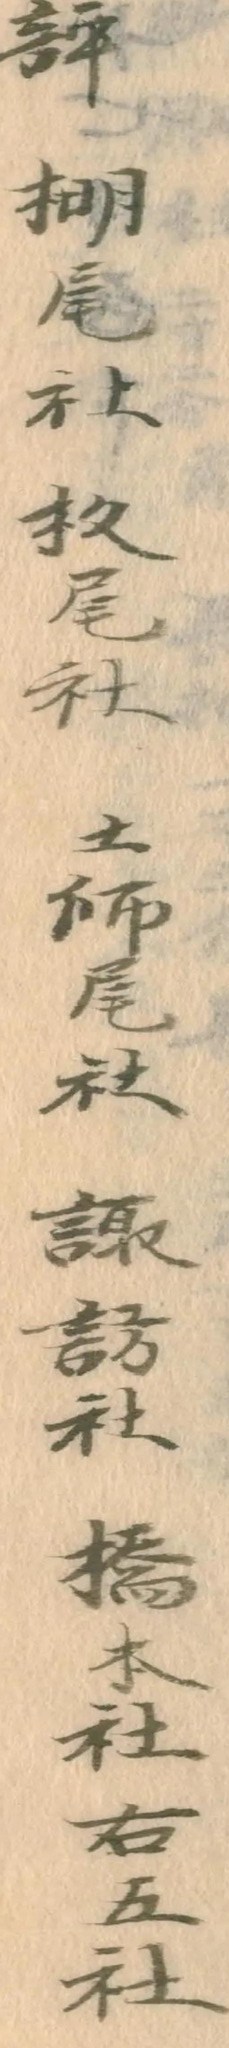評棚尾社杦尾社土師尾社諏訪社橋本社右五社
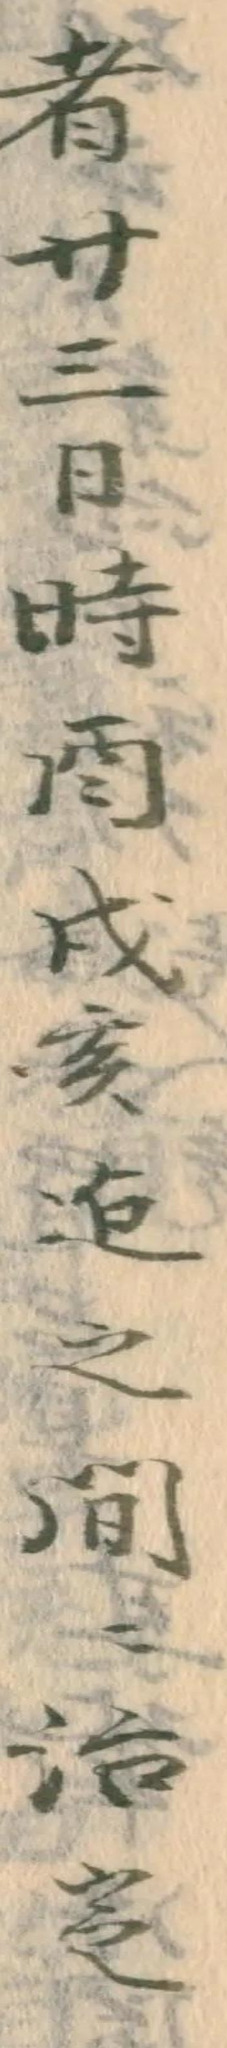は廿三日時酉戌亥迄之間ニ治定
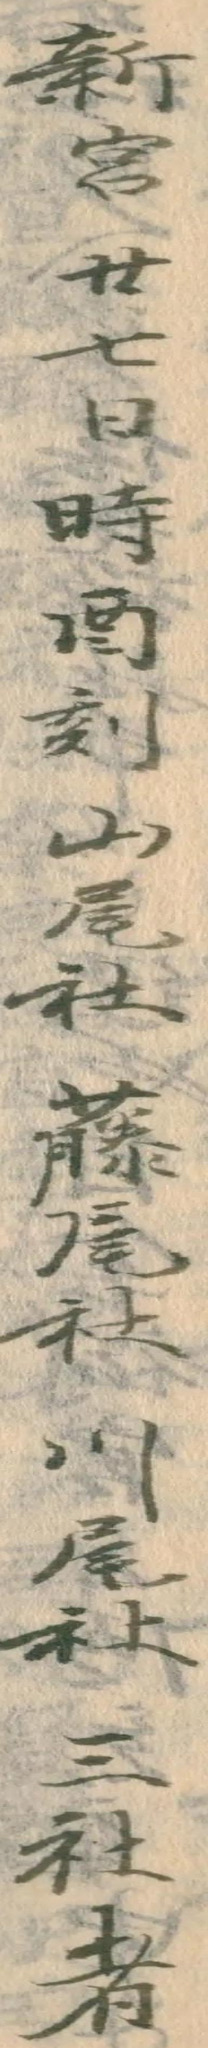新宮廿七日時酉刻山尾社藤尾社川尾社三社は
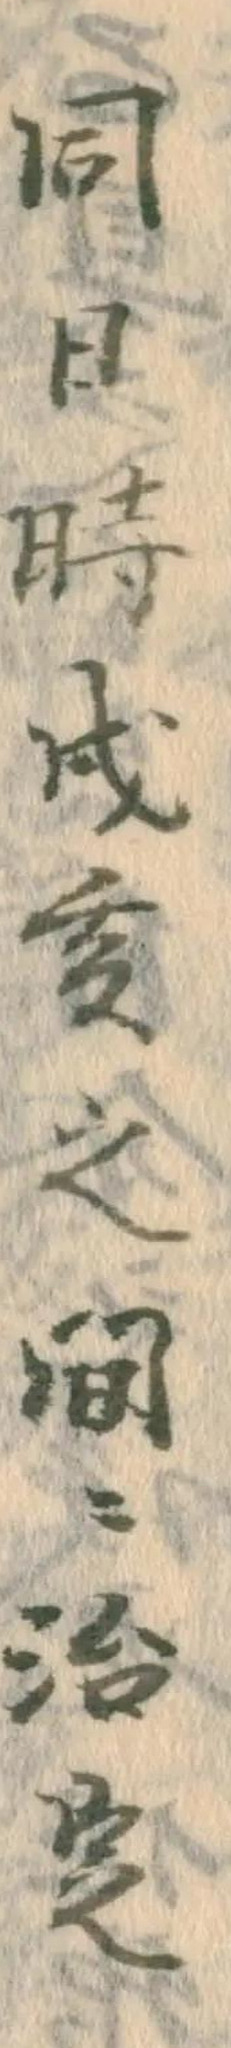同日時戌亥之間ニ治定
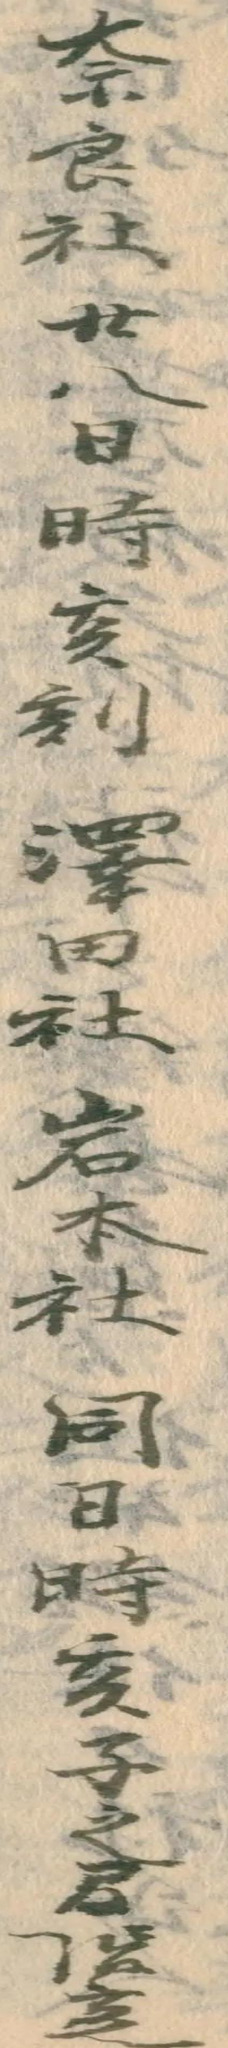奈良社廿八日時亥刻沢田社岩本社同日時亥子之間治定
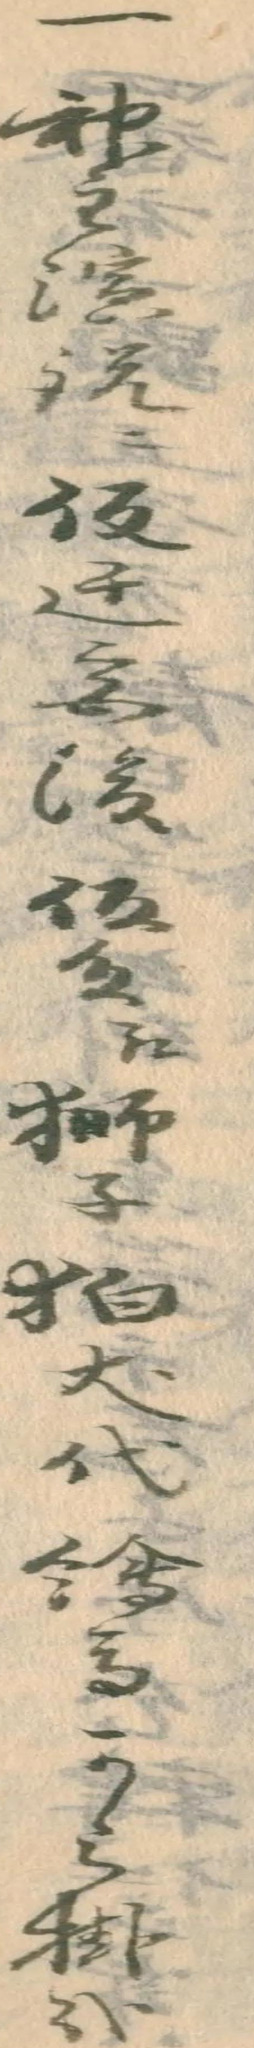一神主演説ニ仮迁宮後仮殿江獅子狛犬代絵馬可被掛哉
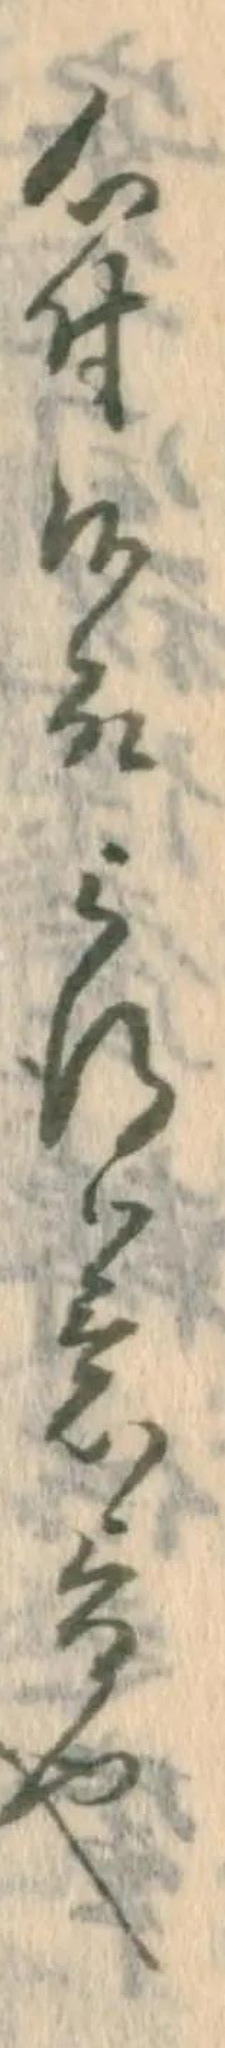心付候故被得御意旨也
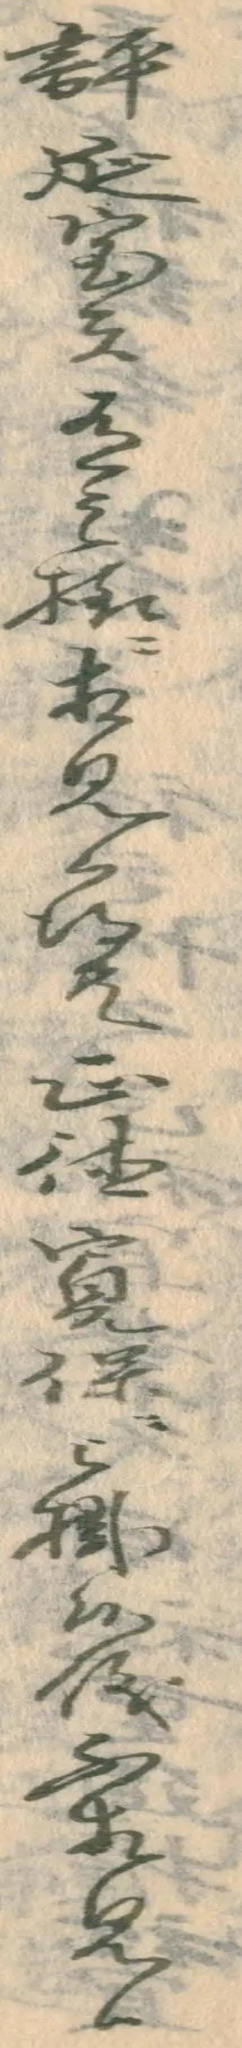評延宝は有之様ニ相見候得共正徳寛保ニ被掛候儀不相見候
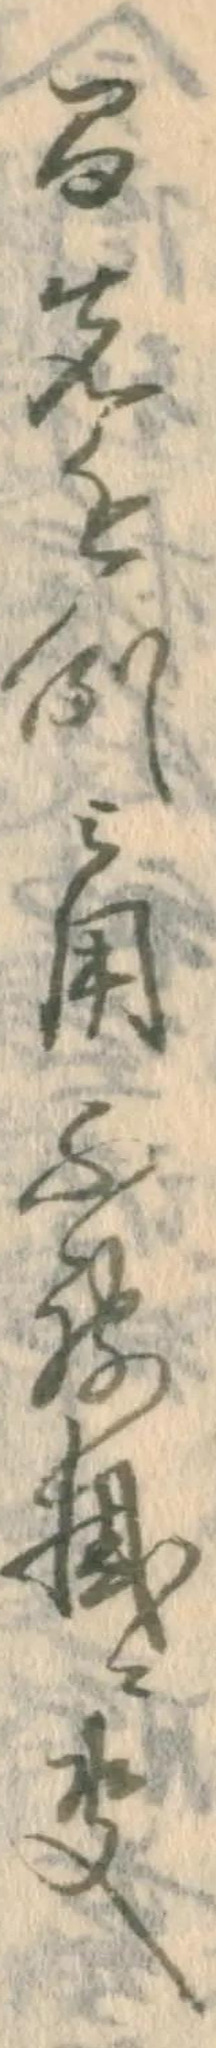間先近例被用不被掛ニ決
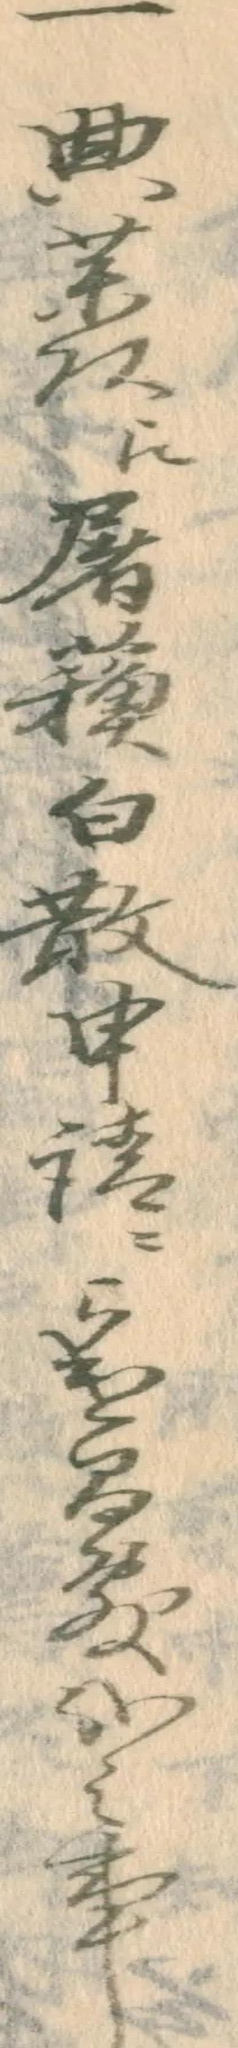一典薬頭江屠蘇白散申請ニ被遣間敷哉之事
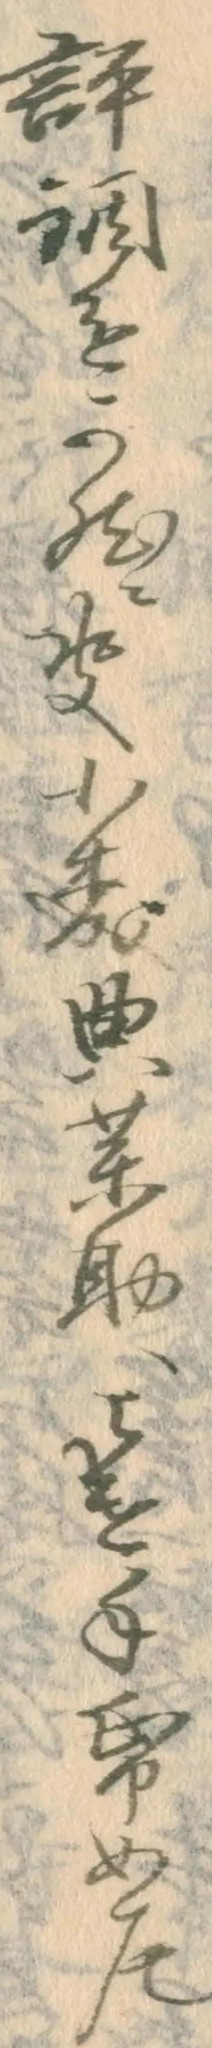評調進可然ニ決小森典薬助へ被遣手帋如左
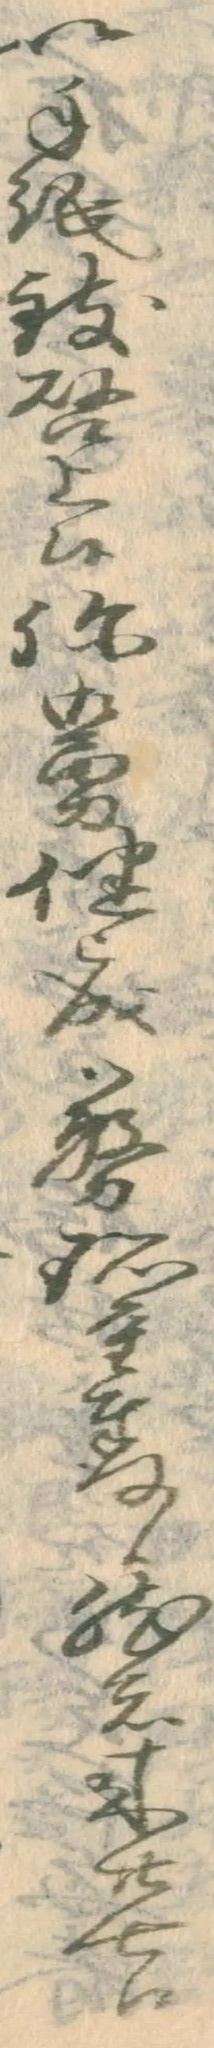以手紙致啓上候弥御勇健被成御務珍重奉存候然は来廿七日
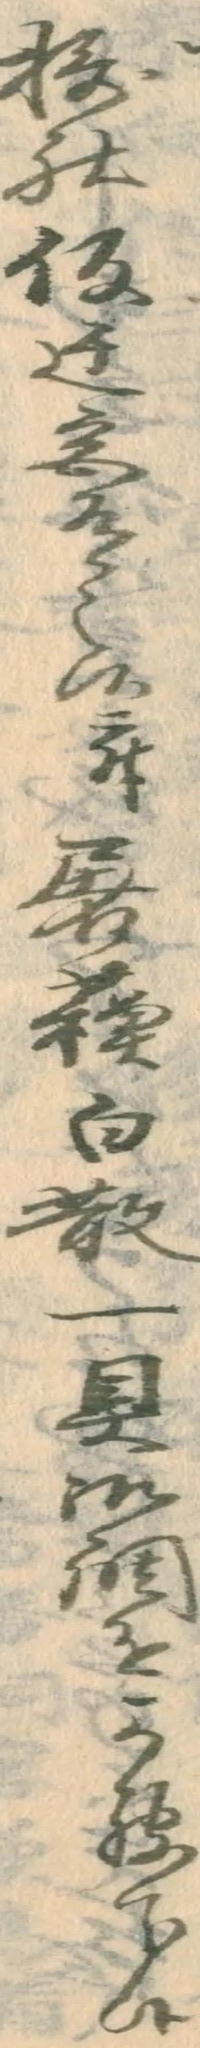摂社仮迁宮有之候ニ付屠蘇白散一具御調進可被下候
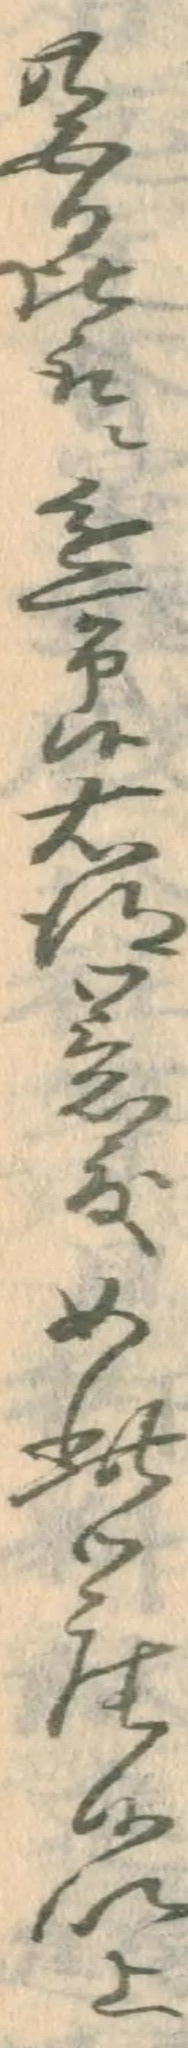廿五日比取ニ進可申候右得御意度如此御座候以上
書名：賀茂社記録. 第17冊
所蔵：国立国会図書館 National Diet Library, JAPAN
